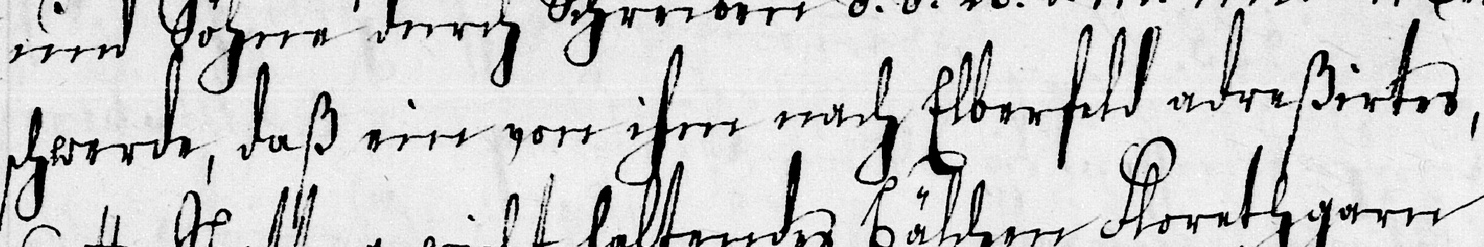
chwerde, daß ein von ihm nach Elberfeld adreßirtes.
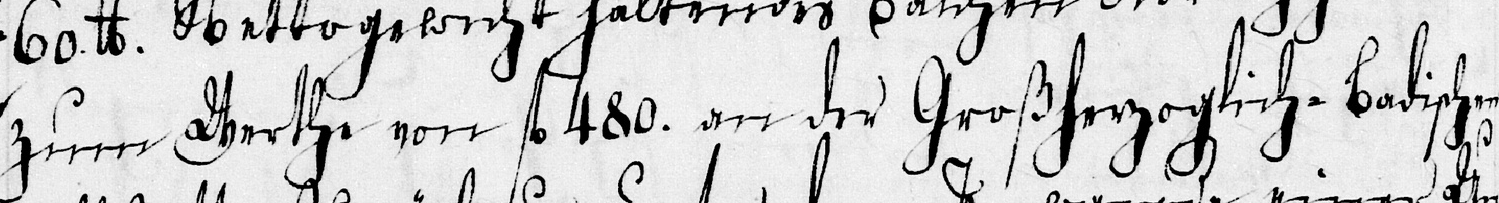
zum Werthe von fl. 480. an der Großherzoglich-Badis¬
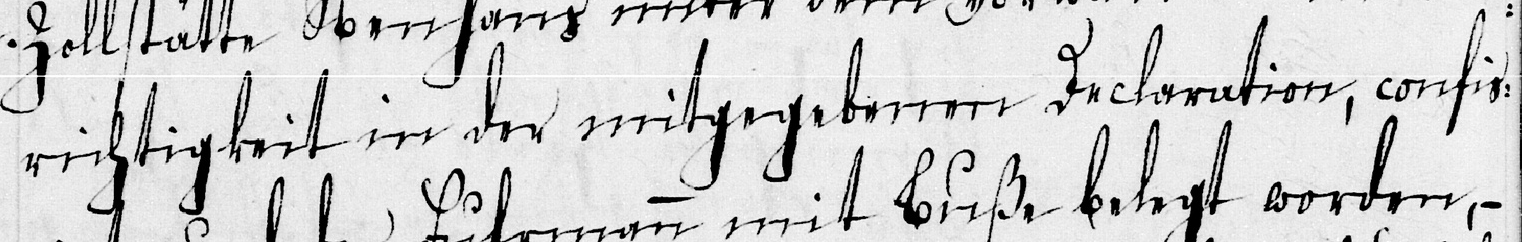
richtigkeit in der mitgegebenen Declaration, confis¬
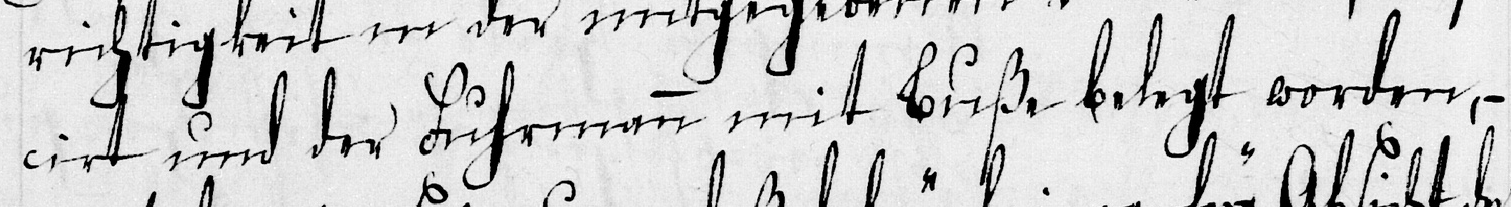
cirt und der Fuhrmann mit Buße belegt worden,
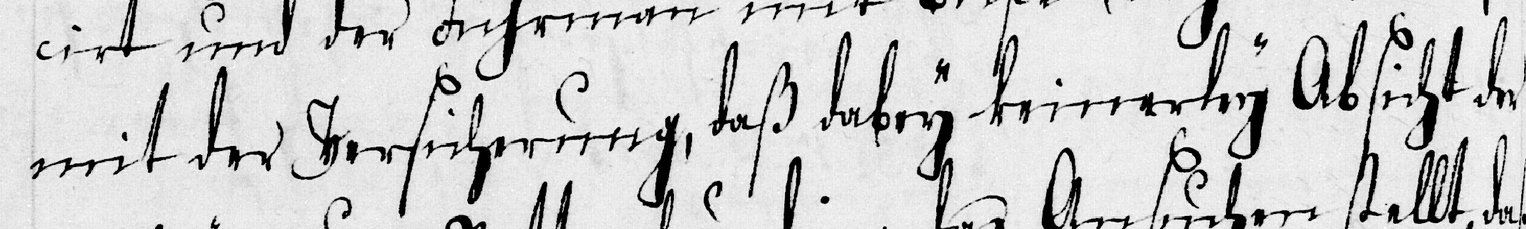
mit der Versicherung, daß dabey keinerley Absicht d¬
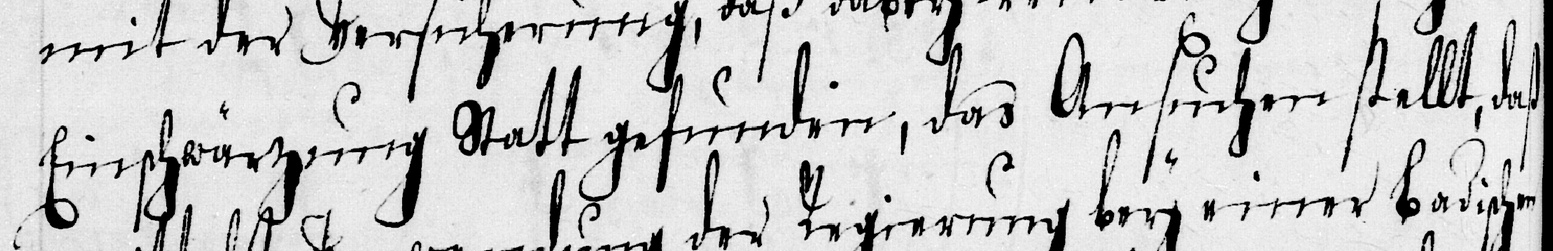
Einschwärzung Statt gefunden, das Ansuchen stellt, daß
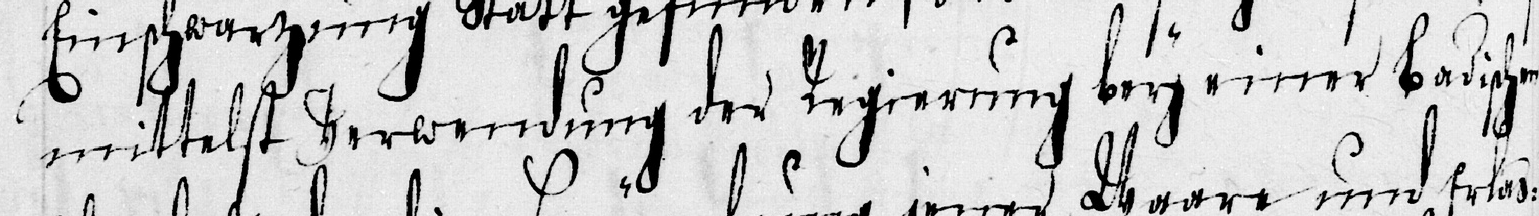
mittelst Verwendung der Regierung bey einer badisch¬
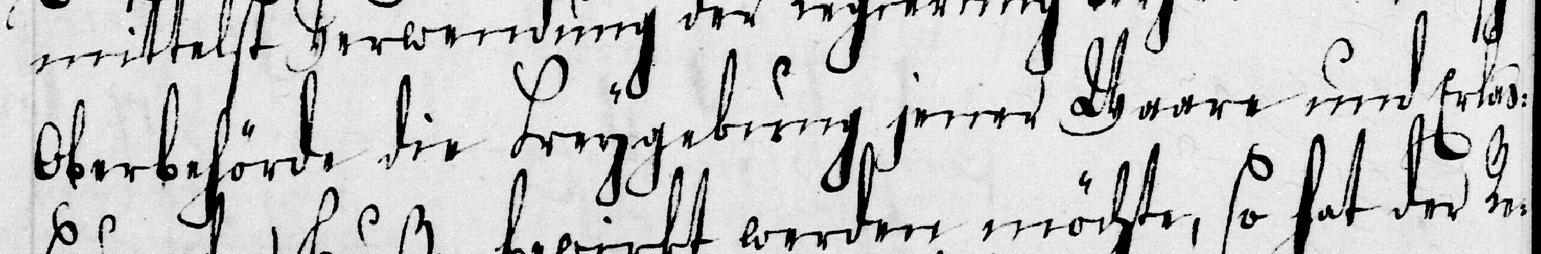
Oberbehörde die Freygebung jener Waare und Erla¬
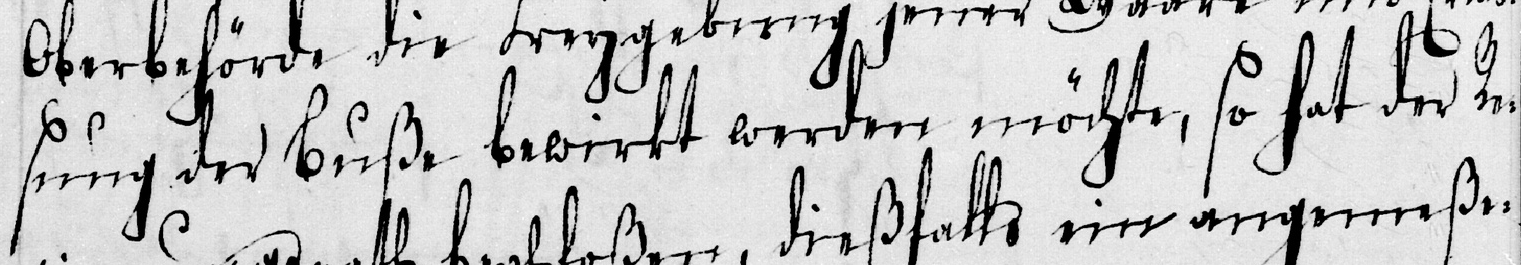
ßung der Buße bewirkt werden möchte, so hat der R¬
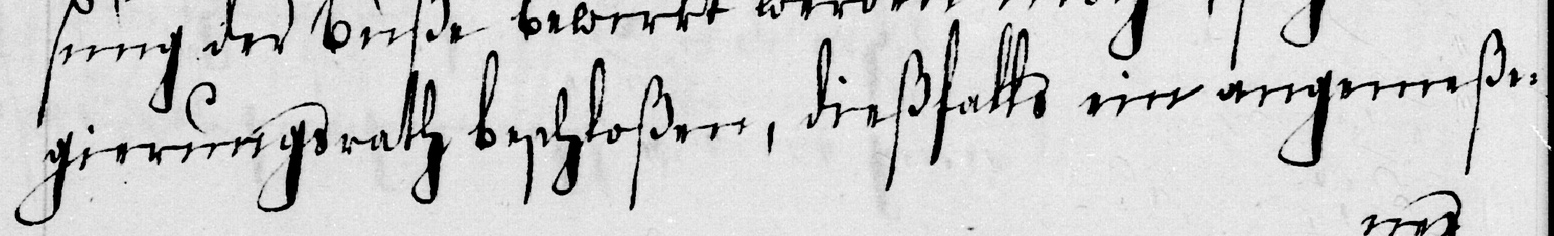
egierungsrath beschloßen, dießfalls ein angemeße-
